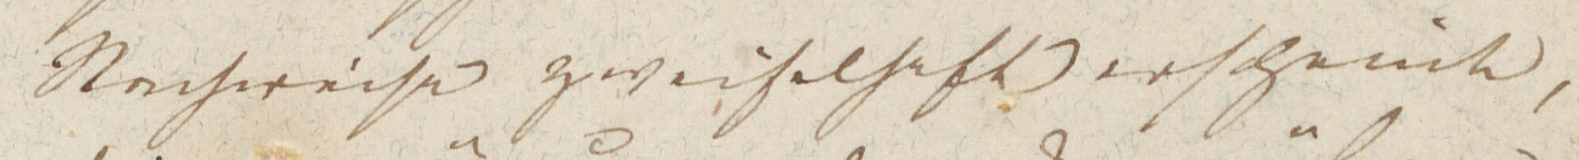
Nachweise zeifelhaft erscheint,
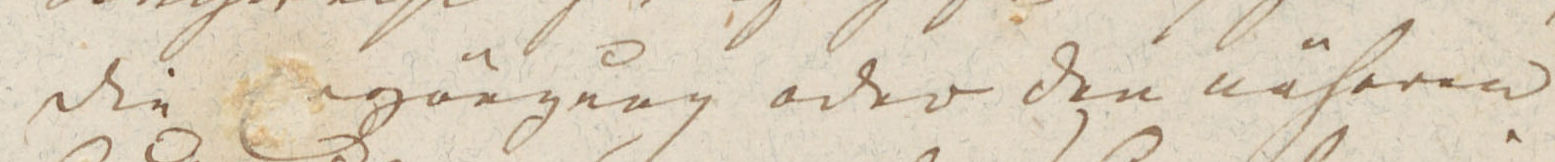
die Ergänzung oder den näheren
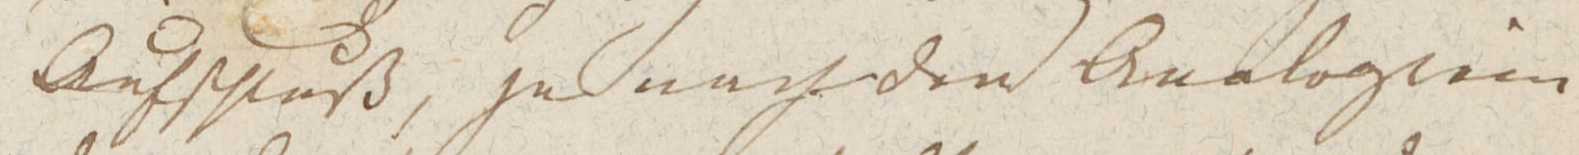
Aufschluss, je nach den Analogieen
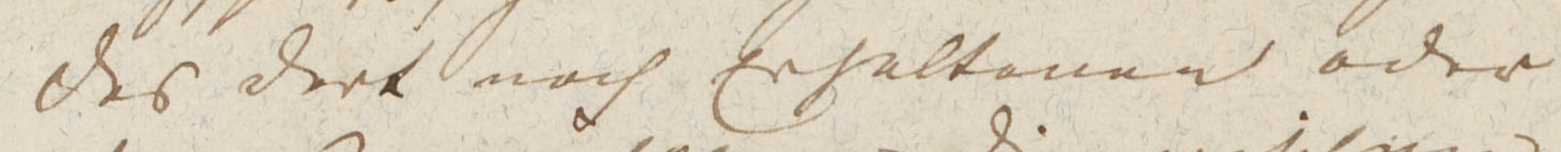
des dort noch Erhaltenen oder
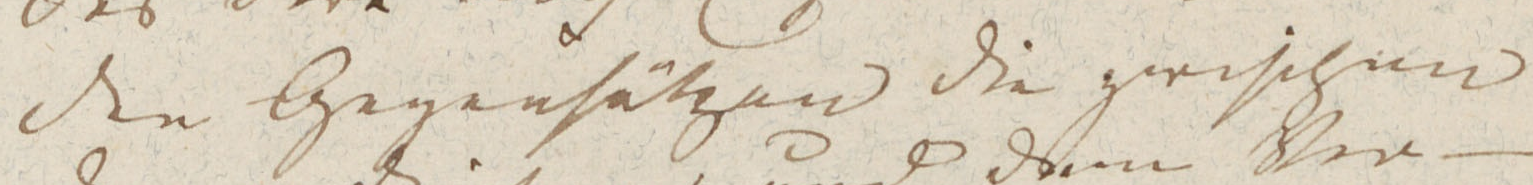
den Gegensätzen die zwischen
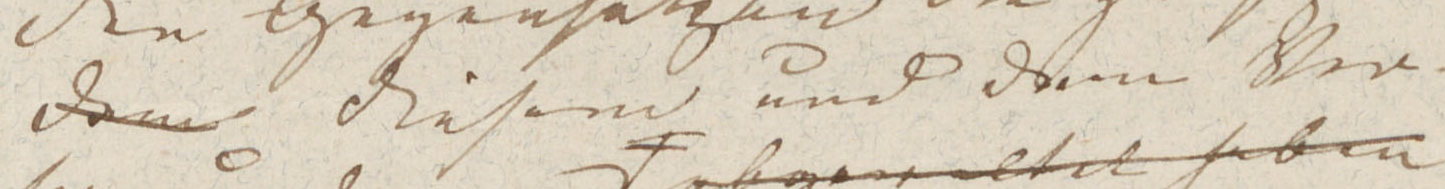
dem diesem und dem Ver-
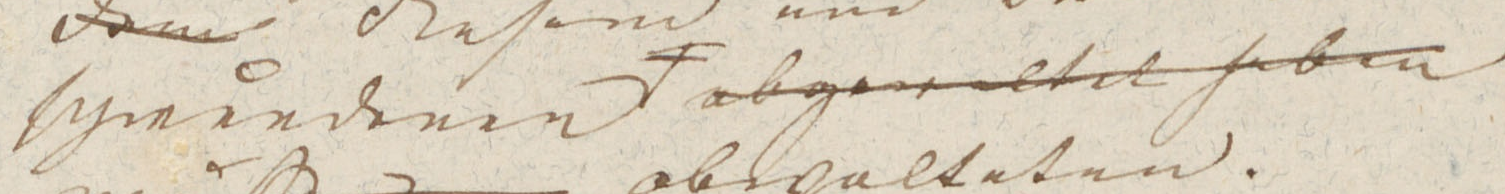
schwundenen % obgewaltet haben
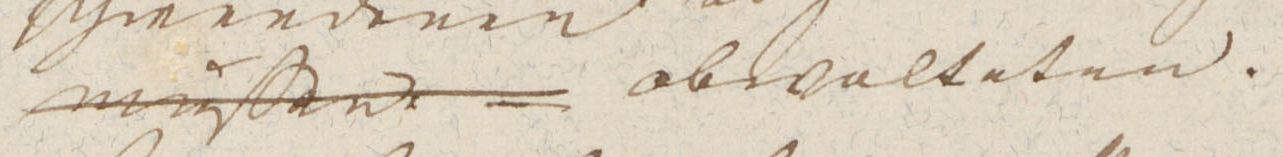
müssen. – obwalteten.
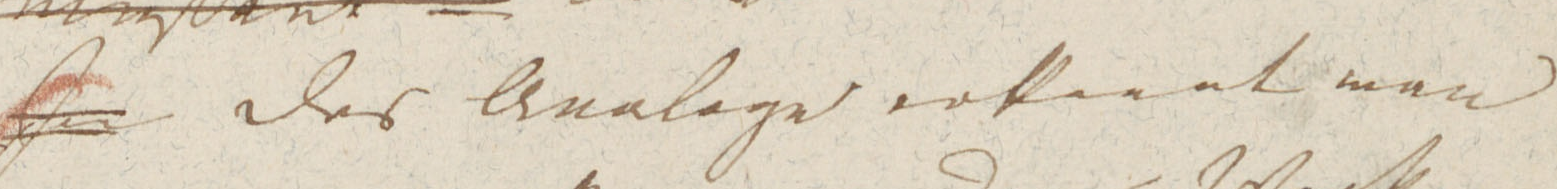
Im Das Analoge erkennt man
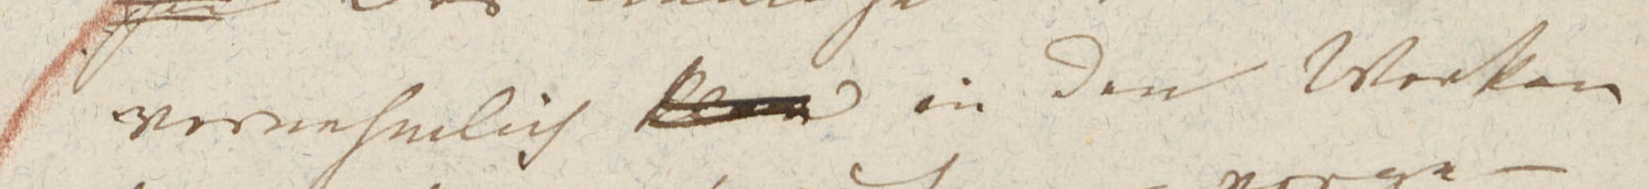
vornehmlich Kl in den Werken
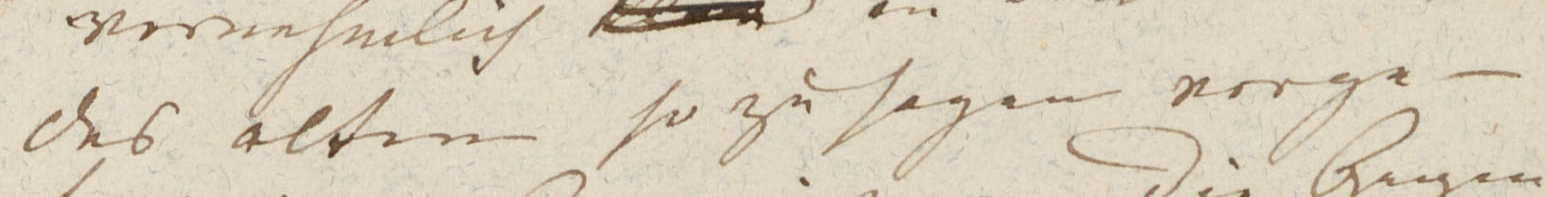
des alten so zu sagen vorge-
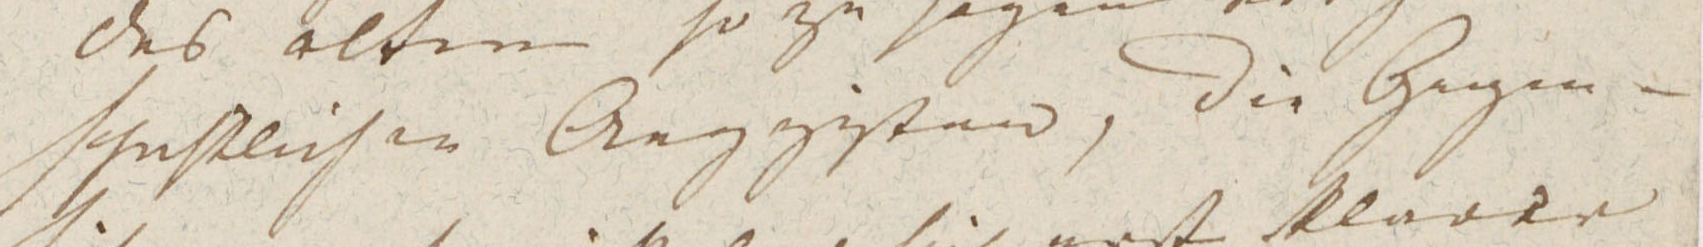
schichtlichen Aegypten, die Gegen-
